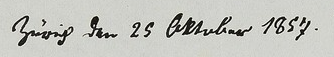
Zürich den 25 Oktober 1857.
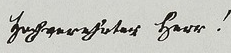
Hochverehrter Herr!
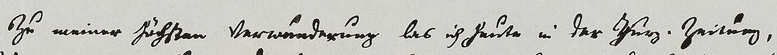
Zu meiner höchsten Verwunderung les ich heute in der Thurg. Zeitung,
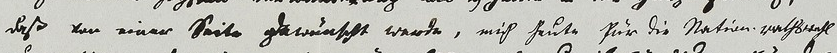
daß von einer Seite gewünscht werde, mich heute für die Nation.rathswahl
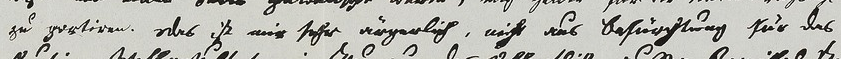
zu portiren. Das ist mir sehr ärgerlich, nicht aus Befürchtung für das
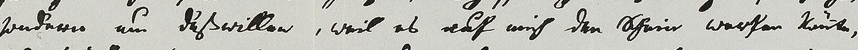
sondern um deßwillen, weil es auf mich den Schein werfen könnte,
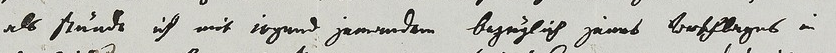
als stünde ich mit irgend jemandem bezüglich jenes Vorschlages in
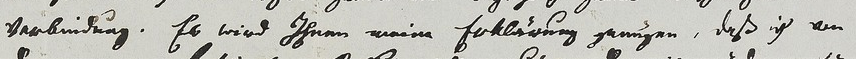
Verbindung. Es wird Ihnen meine Erklärung genügen, daß ich von
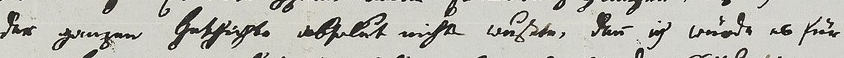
der ganzen Geschichte absolut nichts wußte, denn ich würde es für
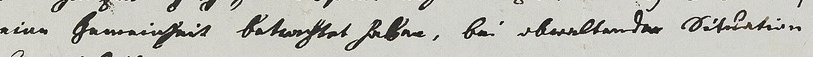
eine Gemeinheit betrachtet haben, bei obwaltender Situation
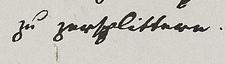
zu zersplittern.
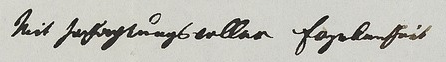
Mit hochachtungsvoller Ergebenheit
